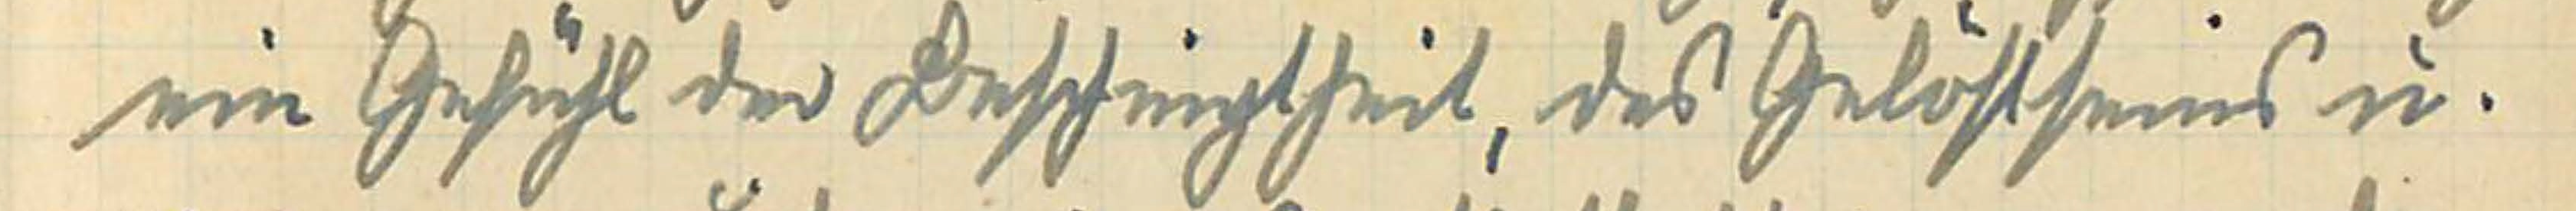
ein Gefühl der Beschwingtheit, des Gelöstseins u.
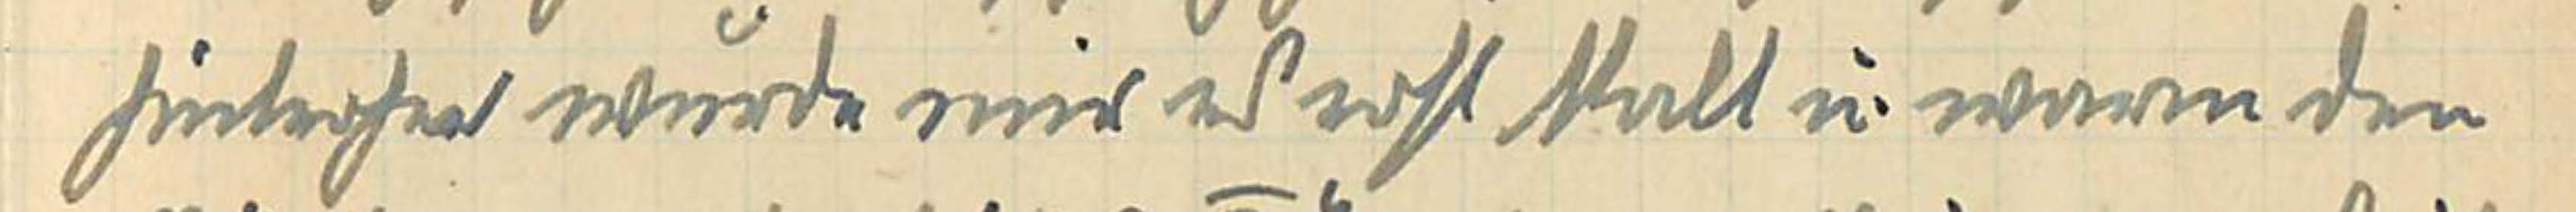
hinterher wurde mir es erst kalt u. warm den
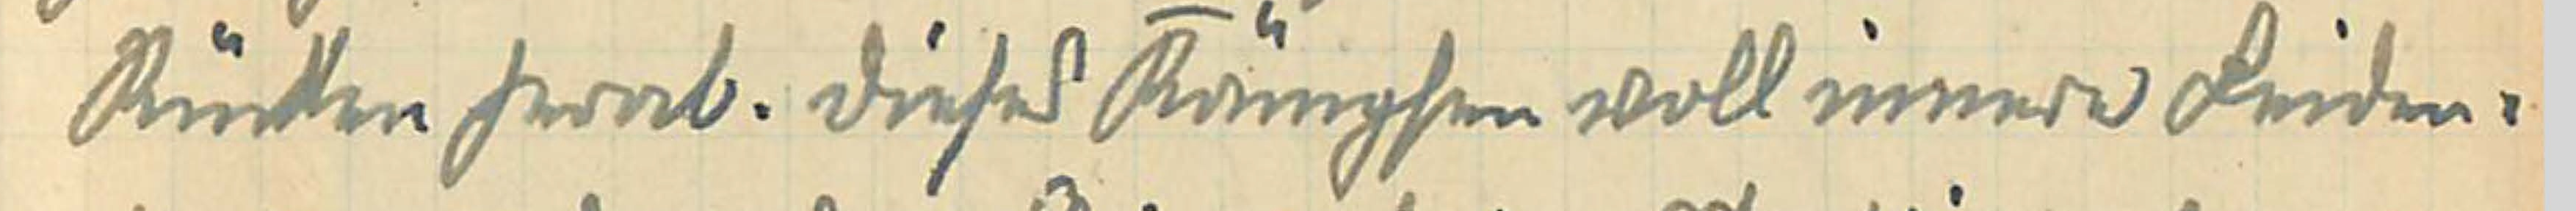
Rücken herab. Dieses Kämpfen voll innerer Leiden-
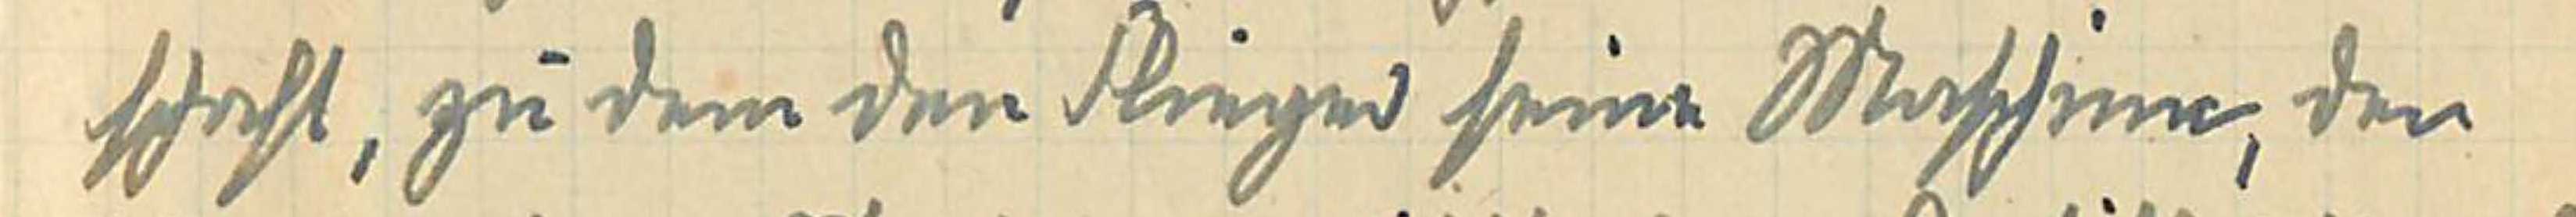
schaft, zu dem den Flieger seine Maschine, den
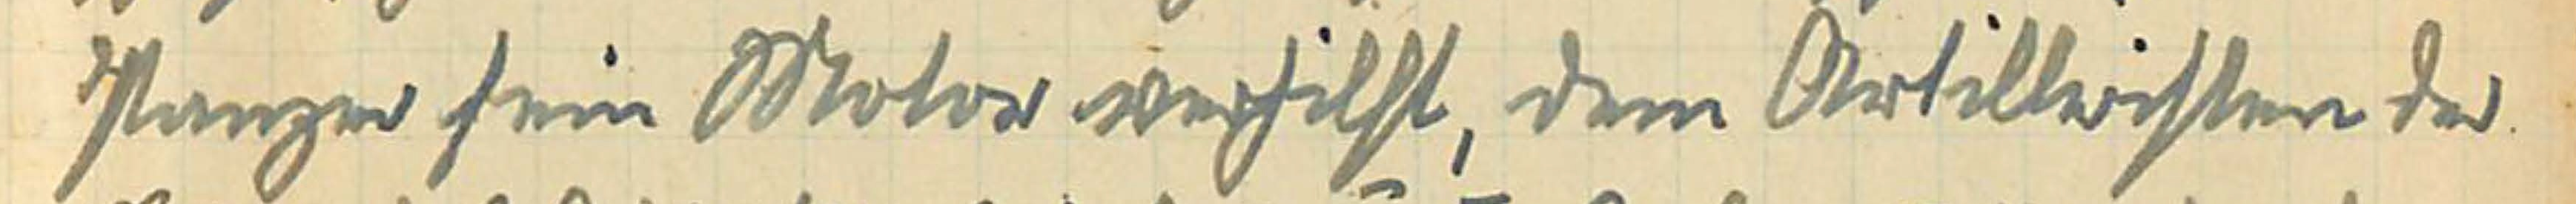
Panzer sein Motor verhilft, dem Artilleristen der
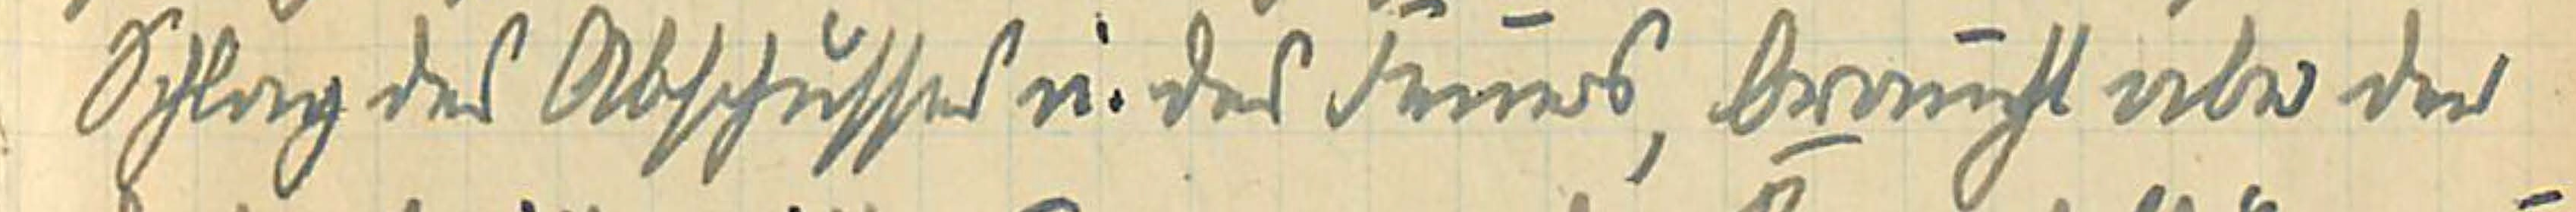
Schlag des Abschusses u. des Feuers, braucht aber der
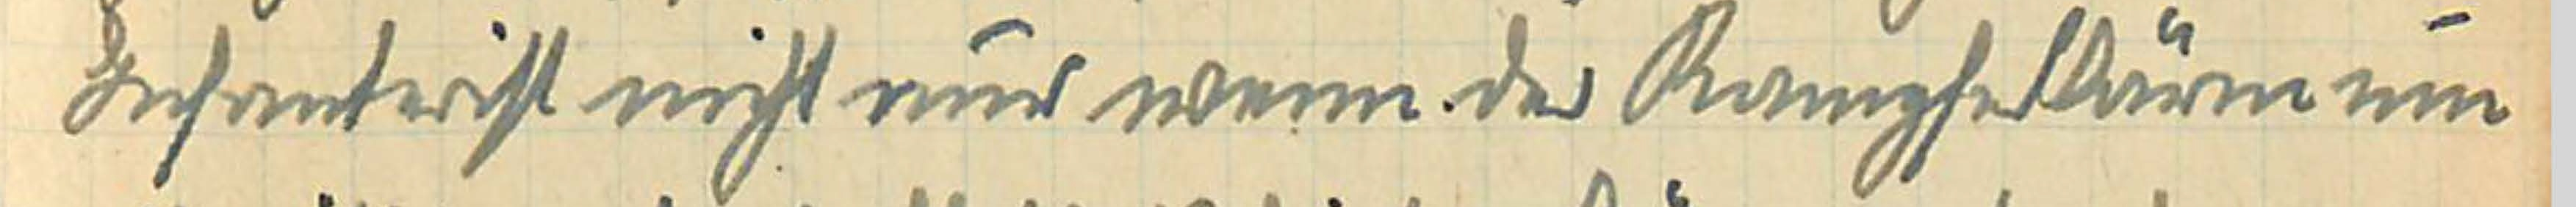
Infanterist nicht nur wenn der Kampfeslärm um
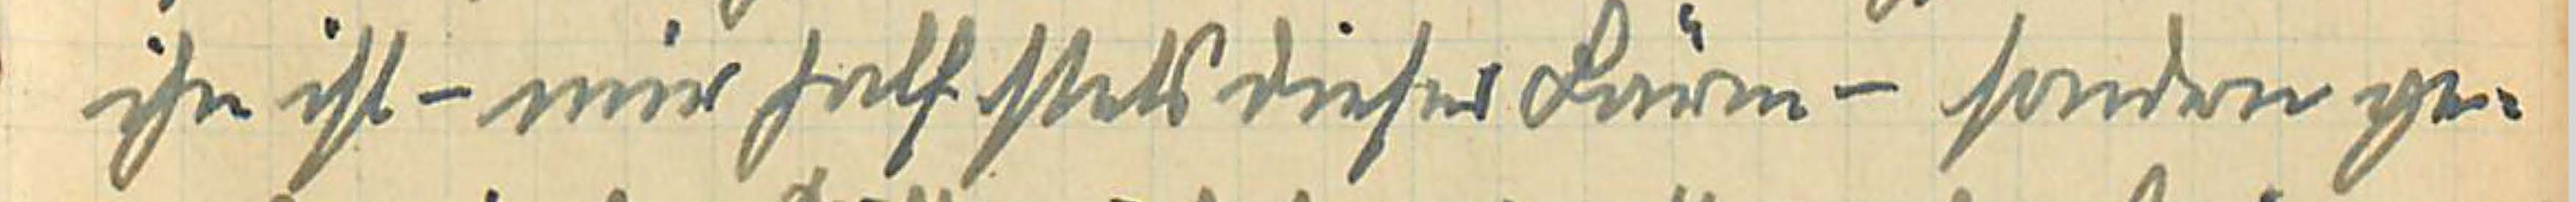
ihn ist – mir half stets dieser Lärm – sondern ge-
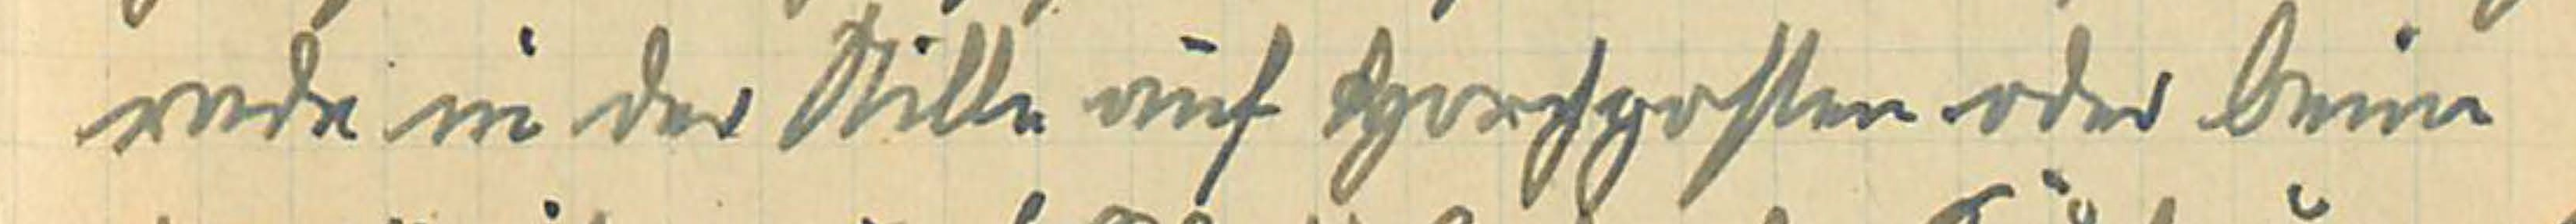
rade in der Stille auf Horchposten oder beim
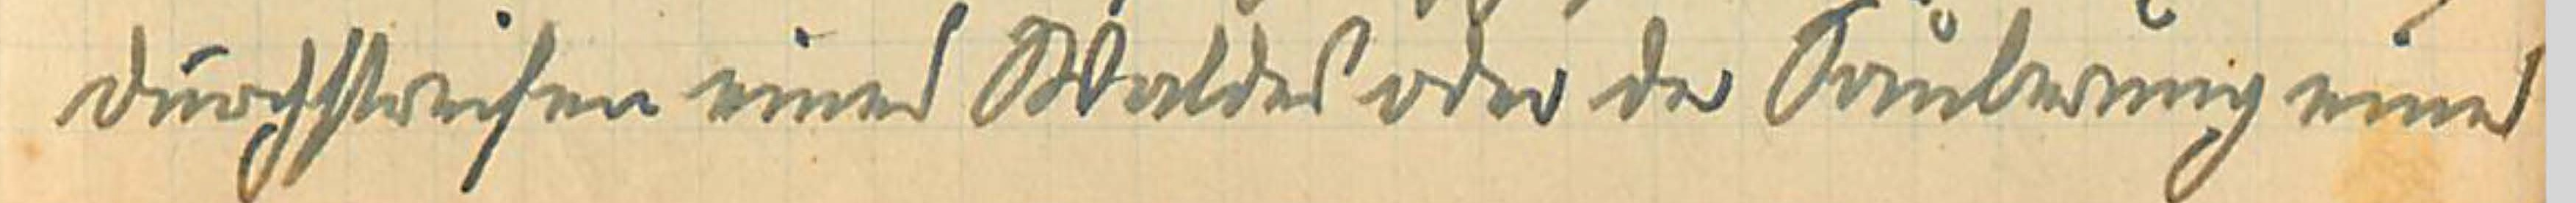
Durchstreifen eines Waldes oder der Säuberung einer
